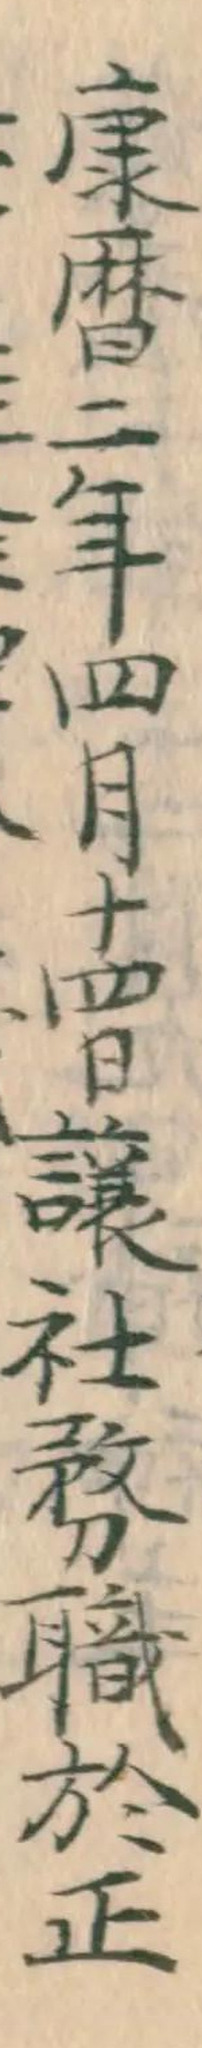康暦二年四月十四日譲社務職於正
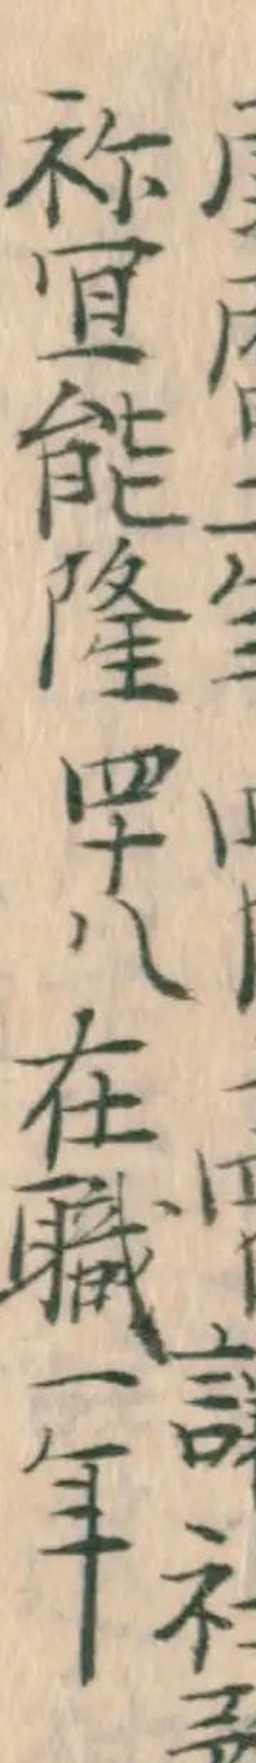祢宜能隆四十八在職一年
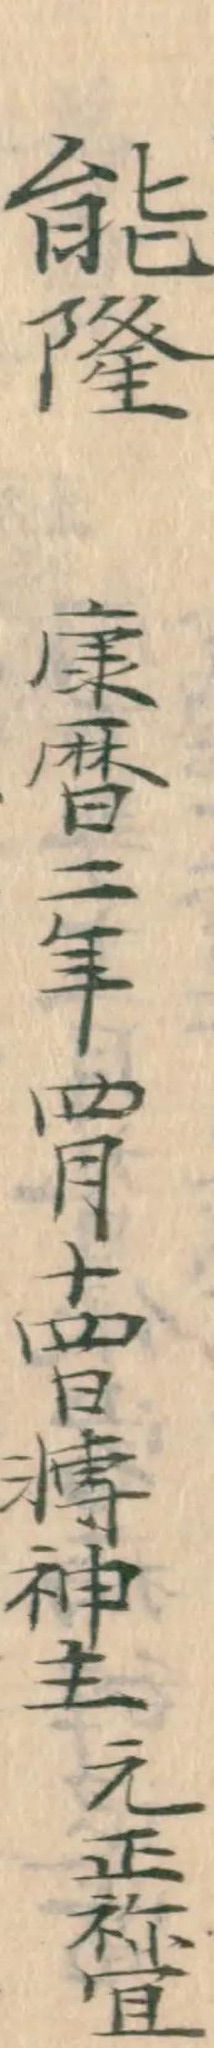能隆康暦二年四月十四日転神主元正祢宜
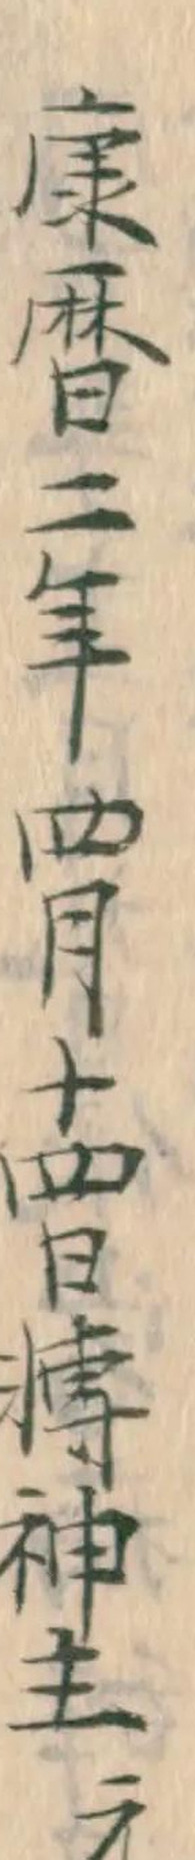康暦二年四月十四日譲社務職於正
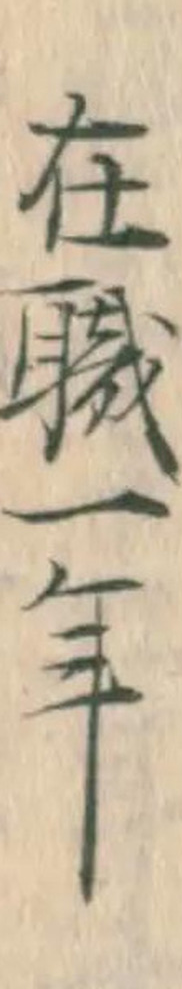在職一年
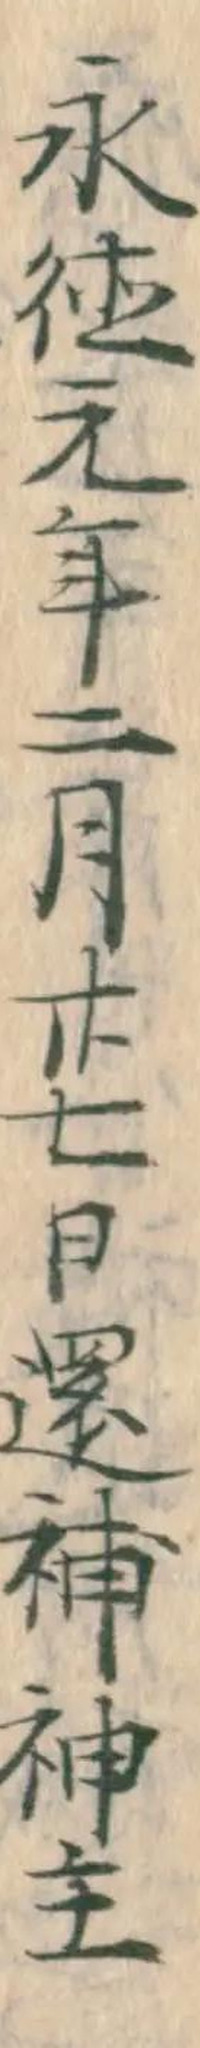修久永徳元年二月廿七日還補神主
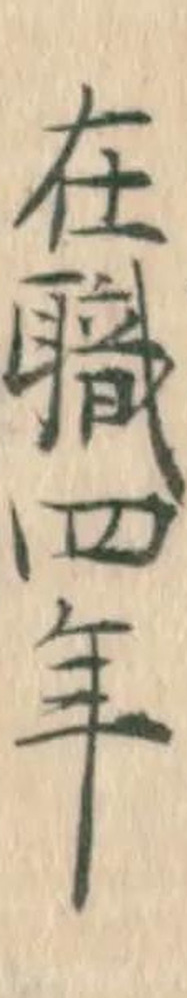在職四年
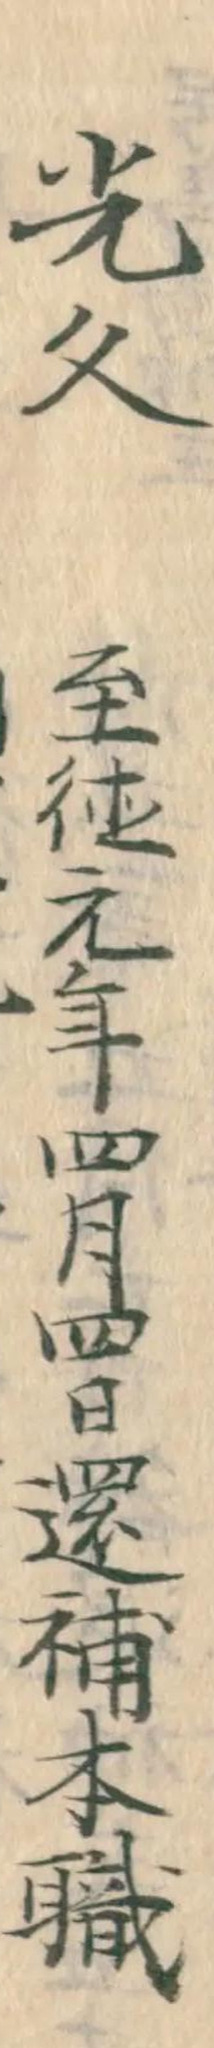光久至徳元年四月四日還補本職
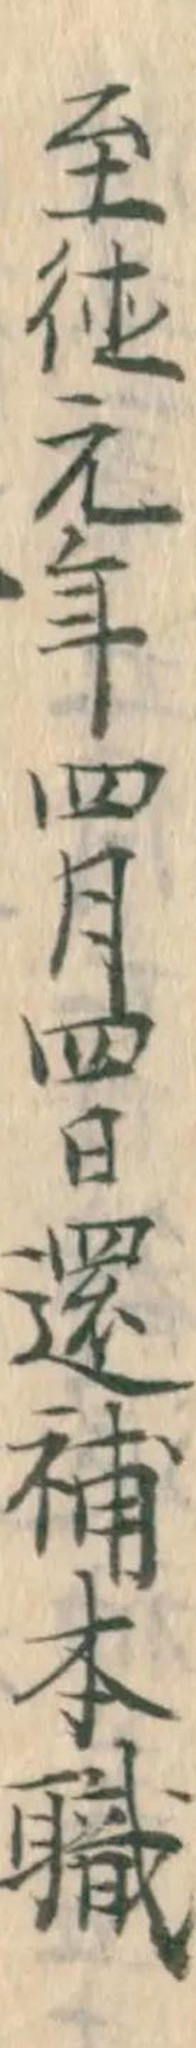光久至徳元年四月四日還補本職
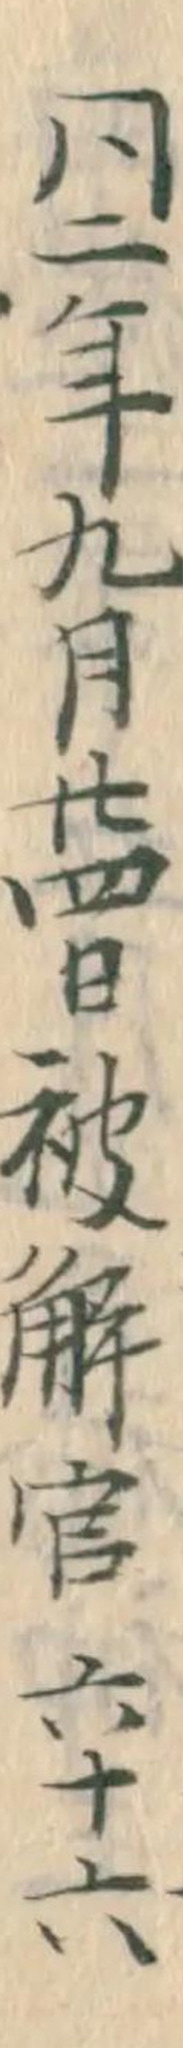同二年九月廿四日被解官六十六
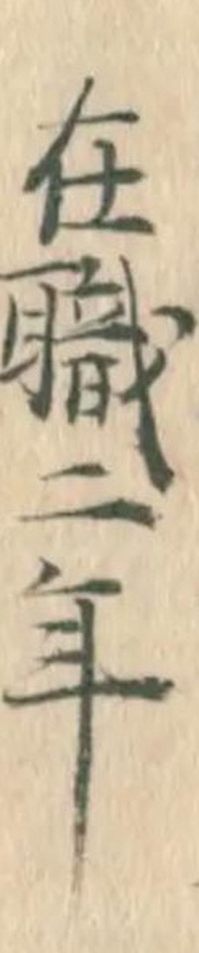在職二年
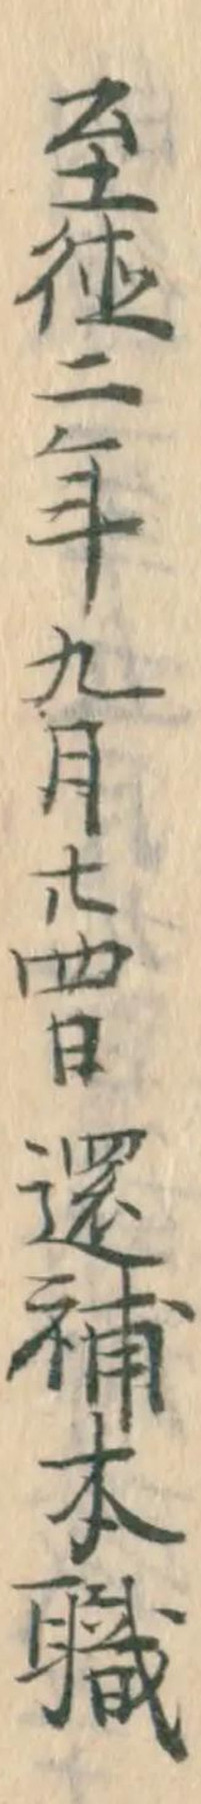脩久至徳二年九月廿四日還補本職

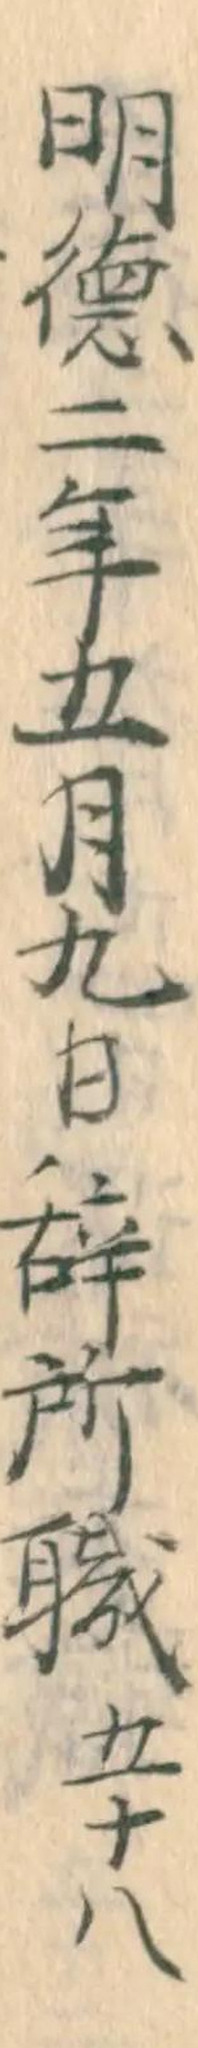明徳二年五月九日辞所職五十八
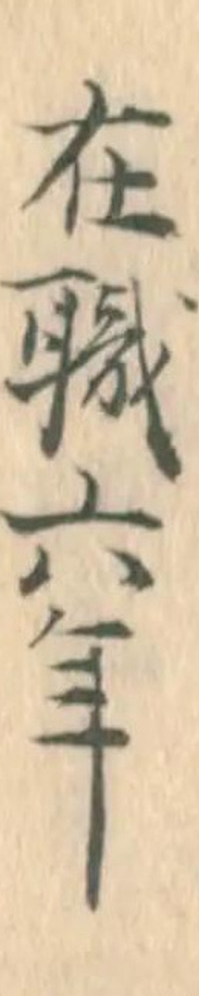在職六年
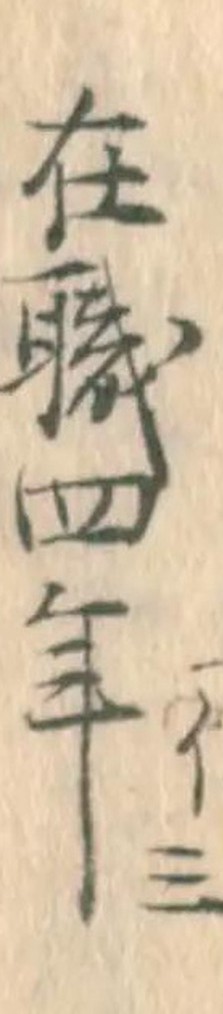在職六年
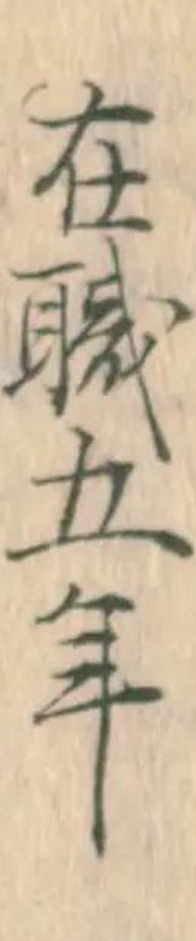在職五年
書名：賀茂社記録. 第23冊
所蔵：国立国会図書館 National Diet Library, JAPAN
